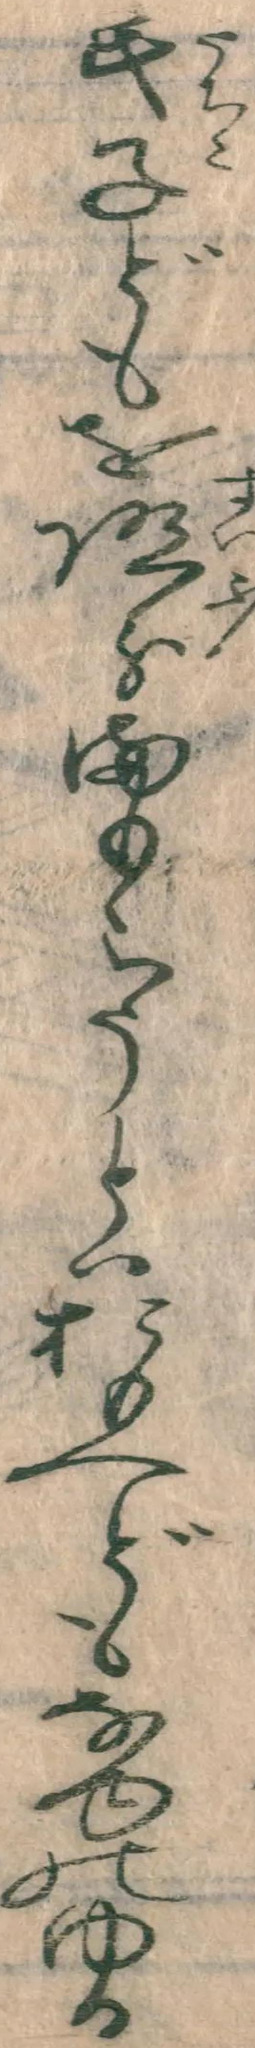氏子どもを随分まもらうとはおもへどもなゆのゆる
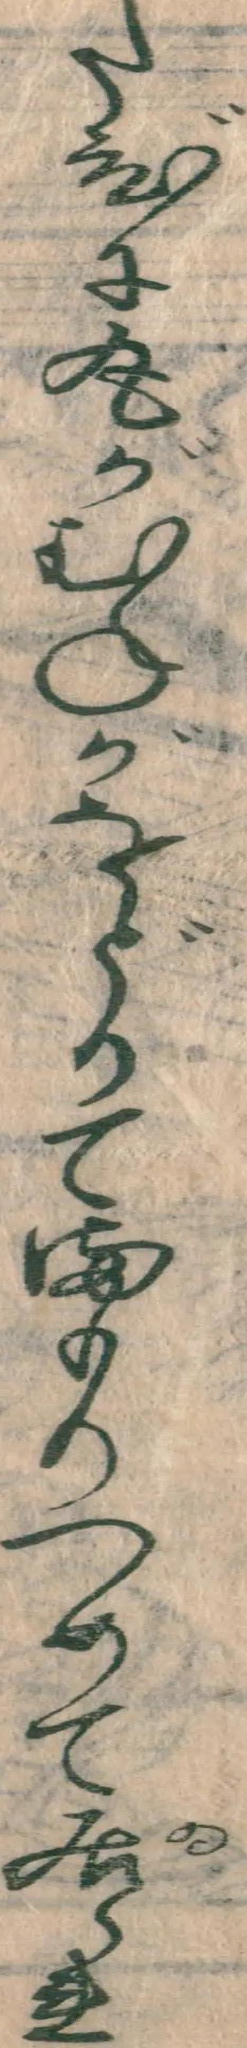たびに丸がむねがをどりてまもりつめて居られ
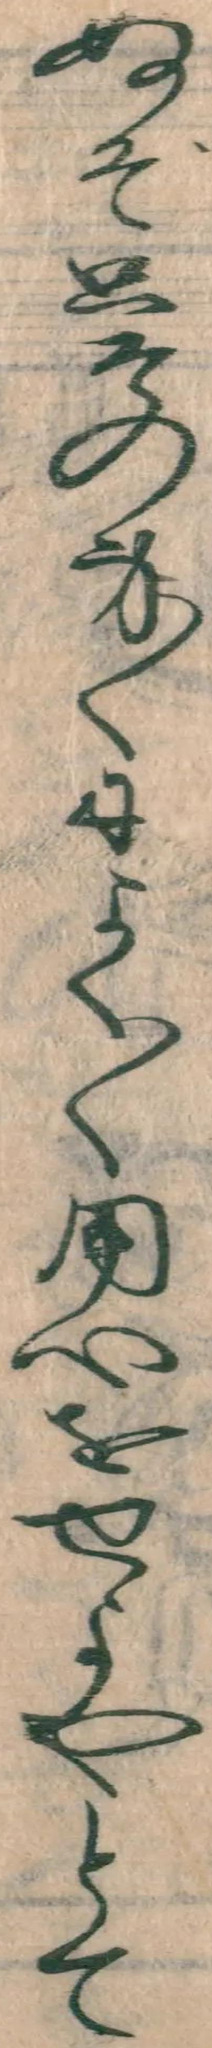ぬぞ只その身〳〵によく〳〵用心をせよやとて
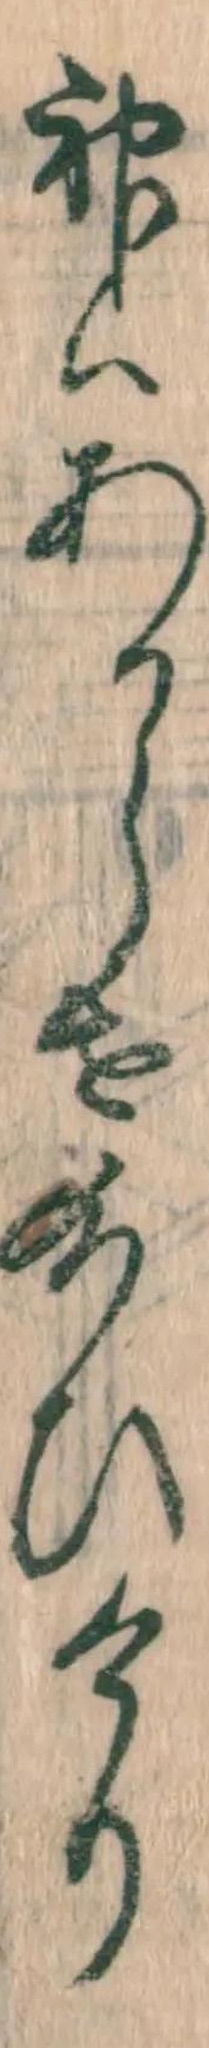神はあがらせ給ひけり
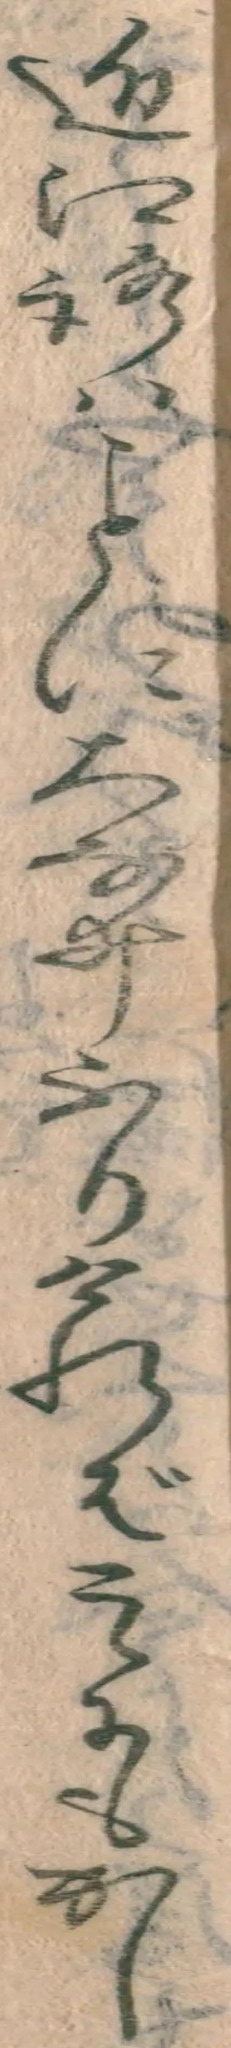近江路はことに大なゐふりければこゝにもかし
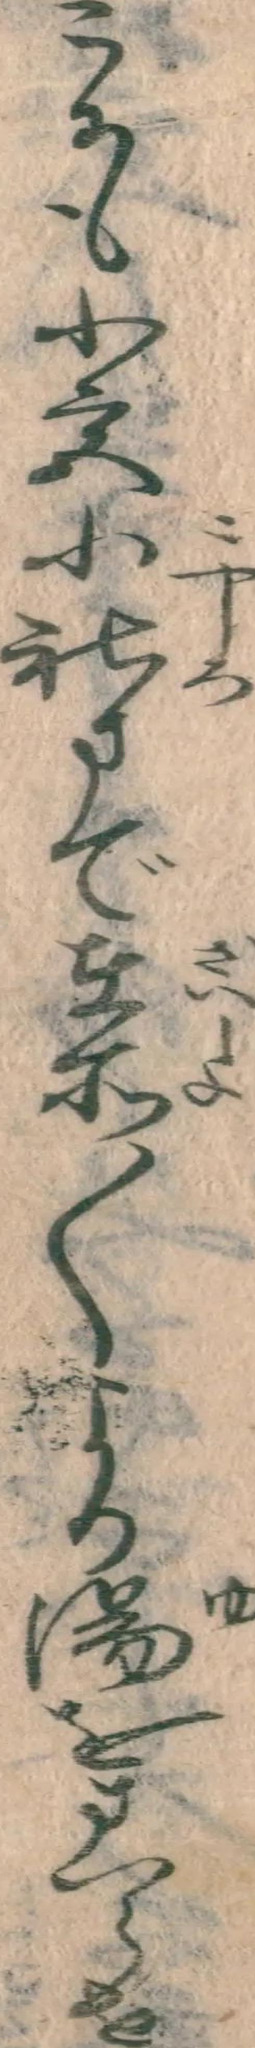こにも小宮小社まで在所〳〵より湯をまいらせ
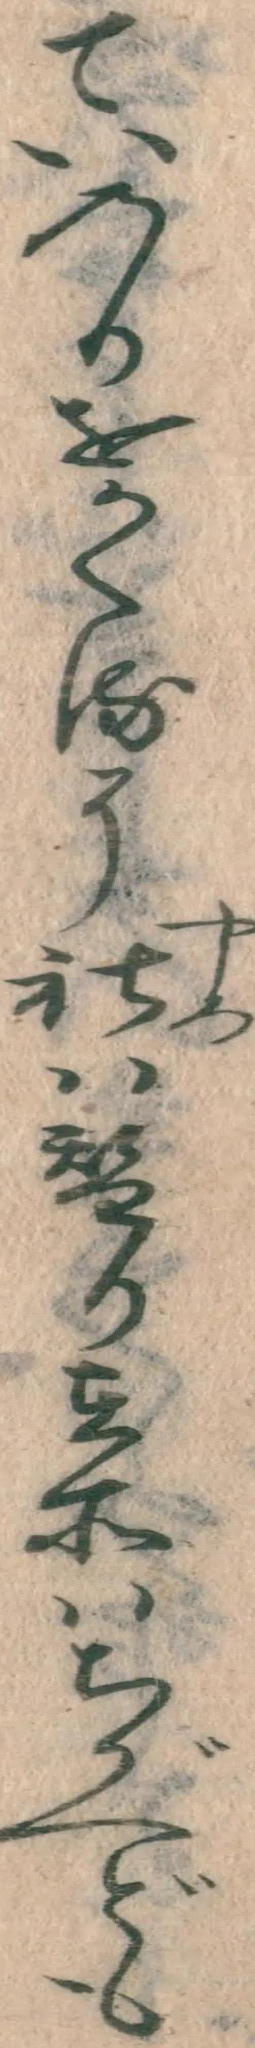ていのりをかくるに社は替り在所はちがへども
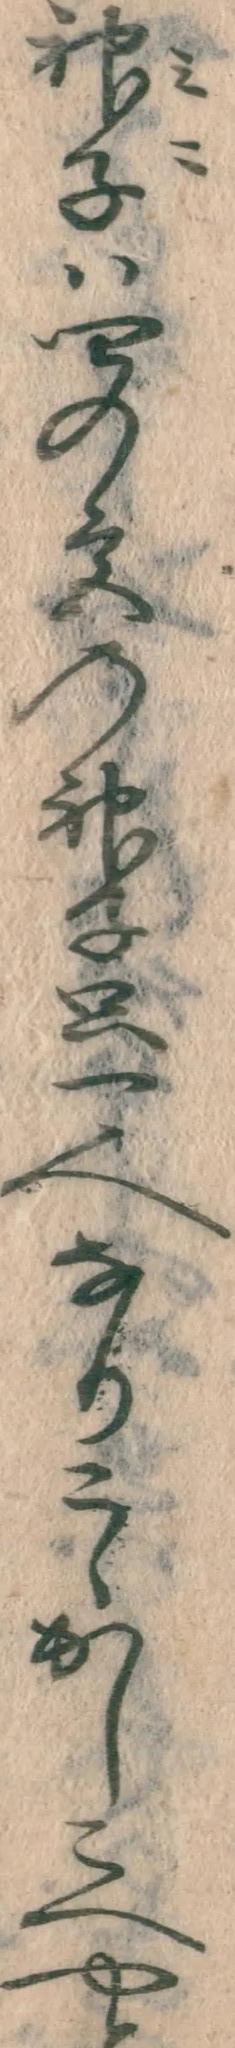神子は四の宮の神子只一人なりこゝかしこへやと
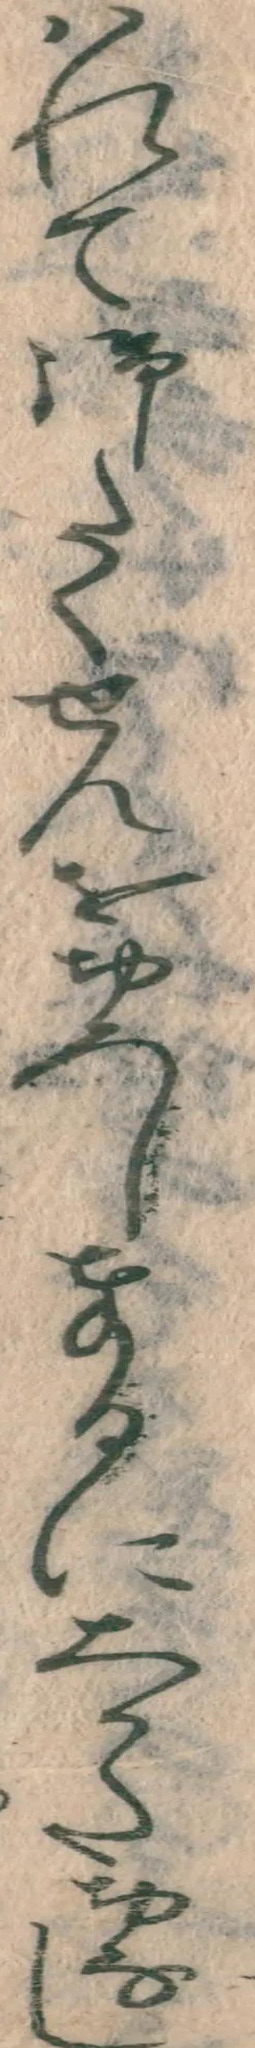はれて御たくせんをおろし奉るに大かたおなし
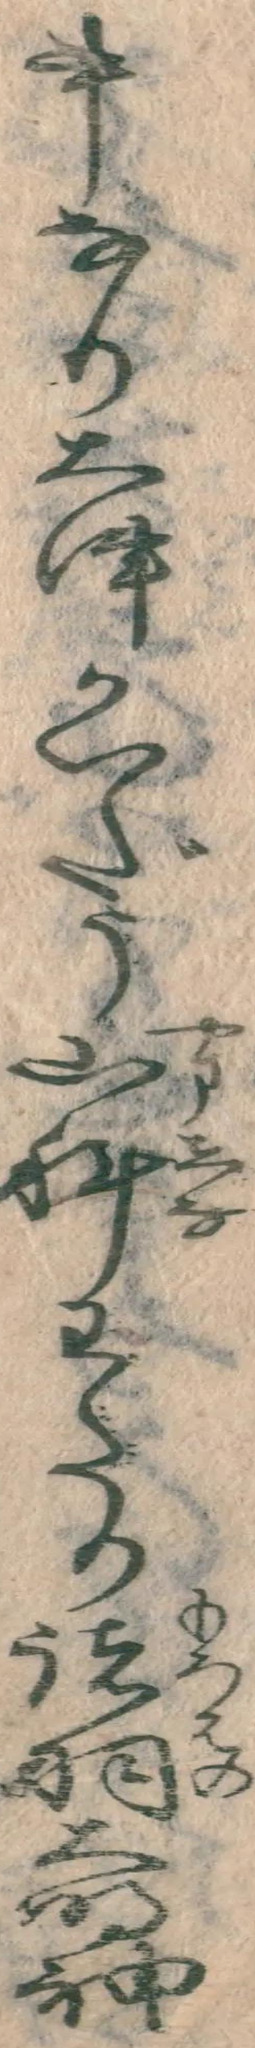事なり大津かいだう山科わたり諸羽大明神
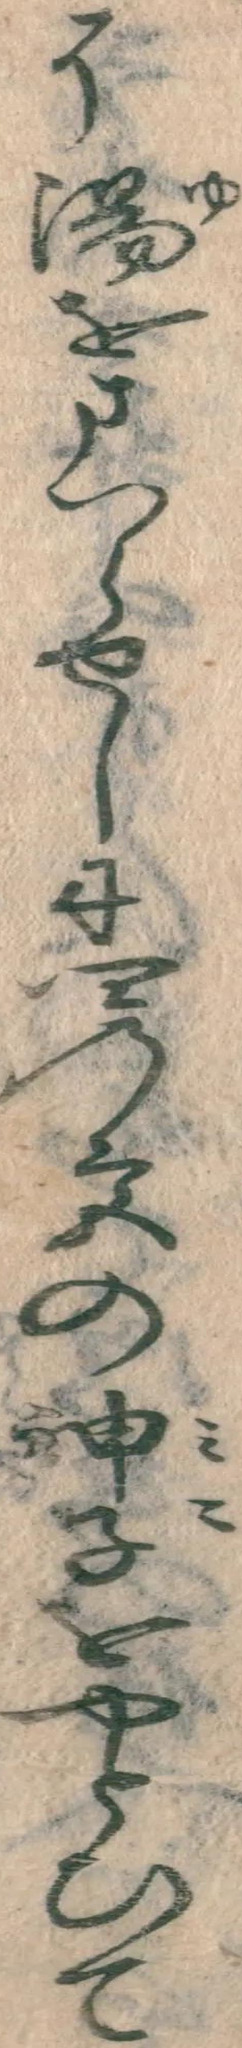に湯をまいらせしに四の宮の神子をやとひて
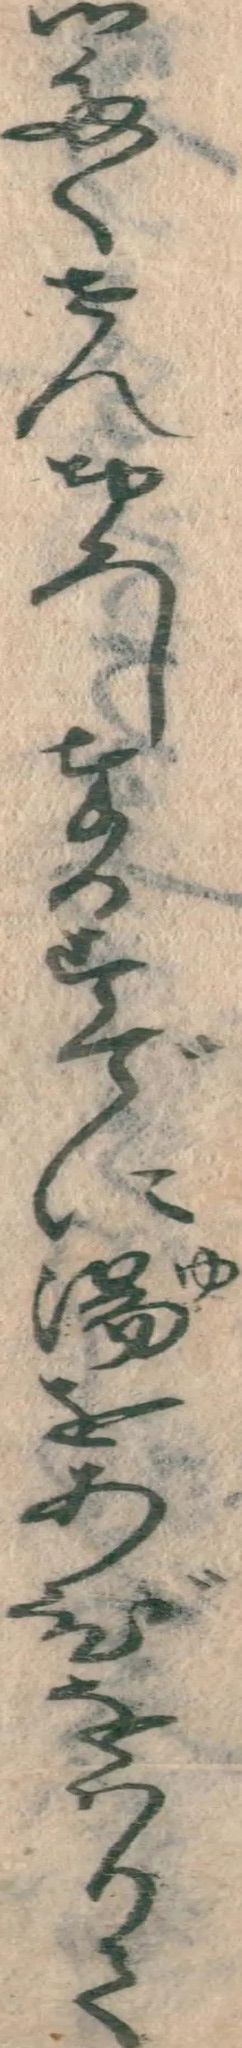御たくせんおろし奉るすでに湯をあびをはりて
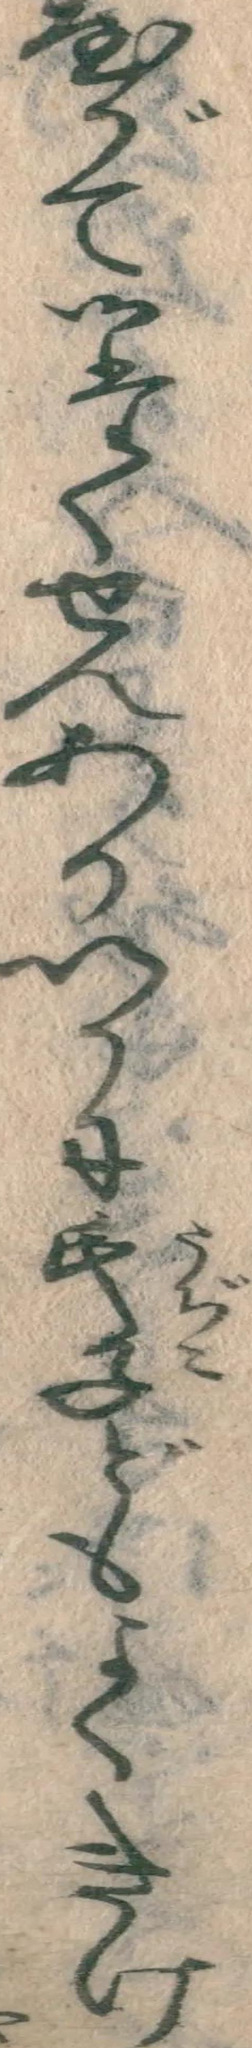やがて御たくせんありいかに氏子どもよくきけ
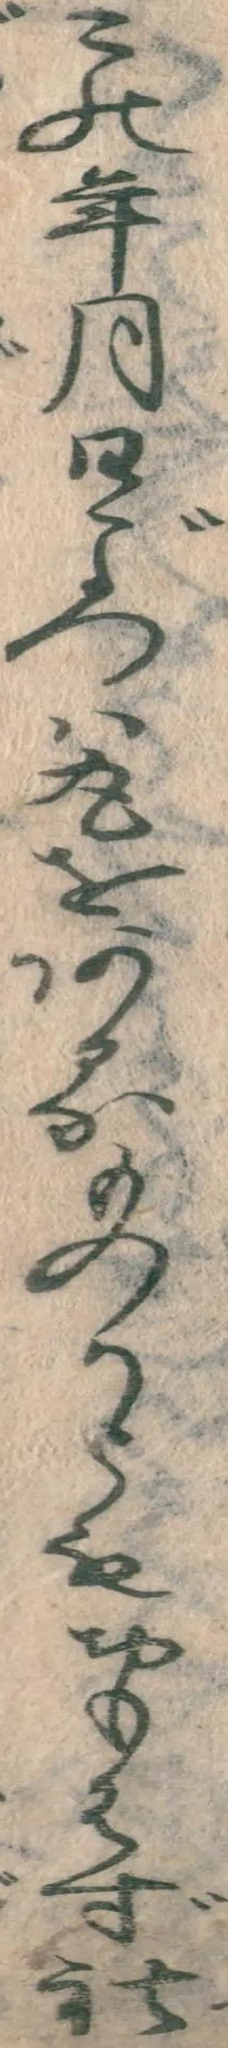この年月日ごろは丸をあるものかともおもえず社
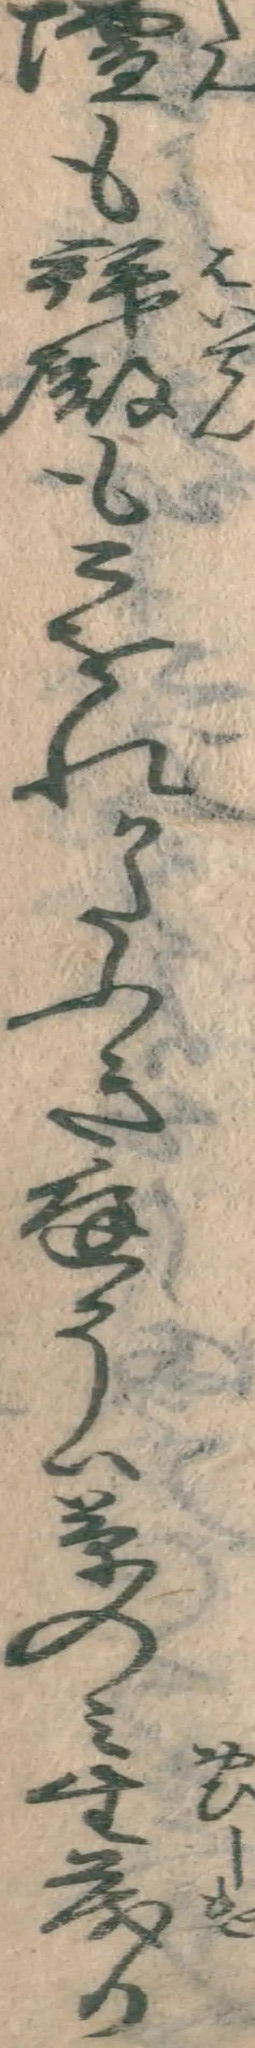壇も拝殿もこをれかたふき邊には草のみ生茂りヘごｋ

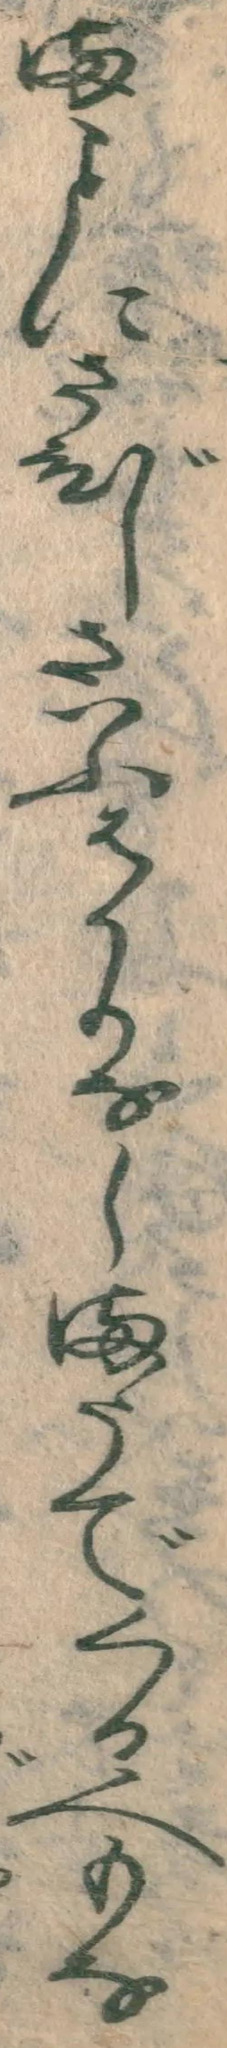まことにさびしさいふはかりなしまうでくる人もな
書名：艱難目異志. 上,下
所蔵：国立国会図書館 National Diet Library, JAPAN
